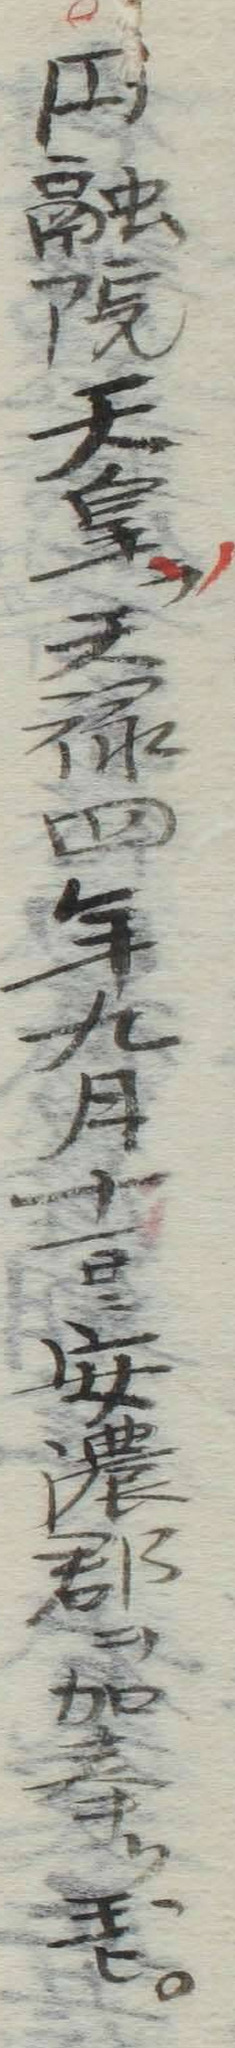○円融院天皇天禄四年九月十一日安濃郡ヲ加奉リ玉ヒ。
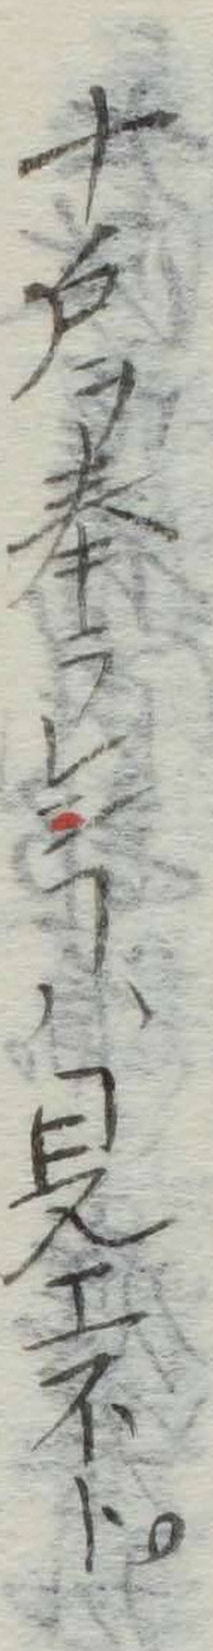十戸ヲ奉ラレシコトハ見エ不ト。
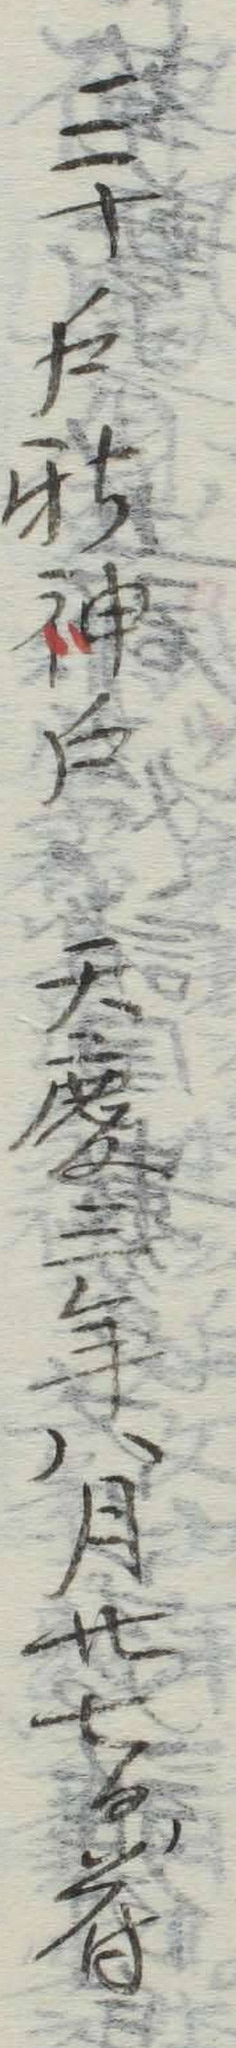三十戸新神戸天慶三年八月廿七日符
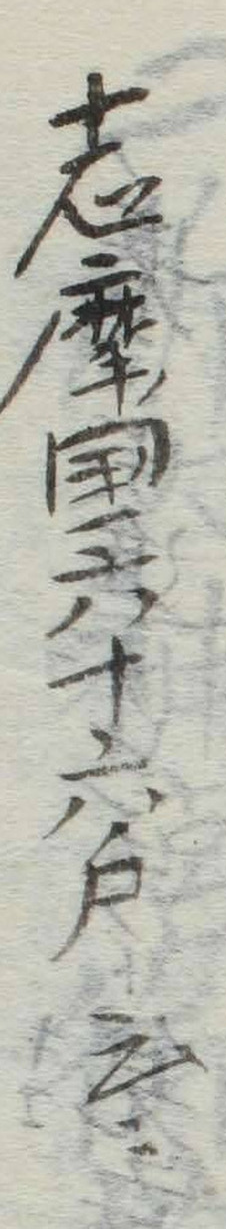志摩国六十六戸云々

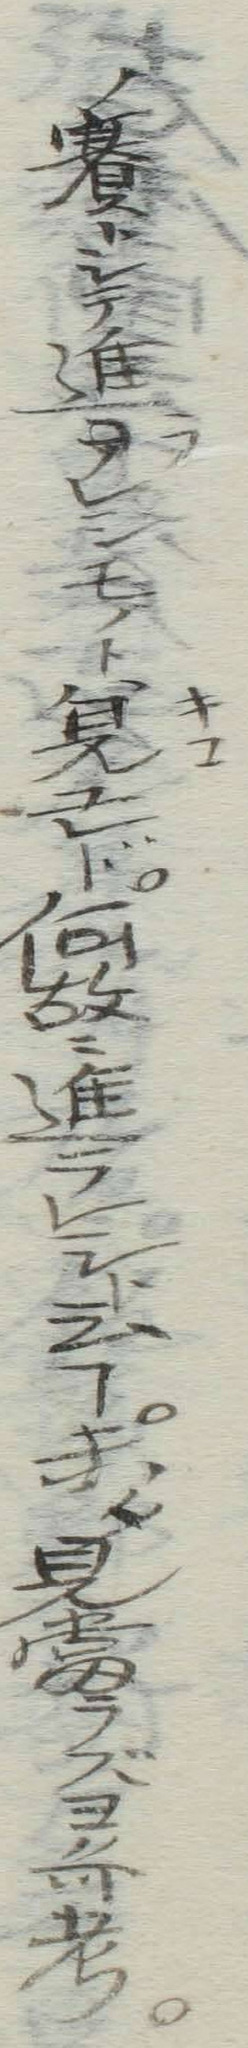ノ賽トシテ進ラレシモノトハ見ユレド。何故ニ進ラレシト云コト。未タ見当ラズヨク可考。
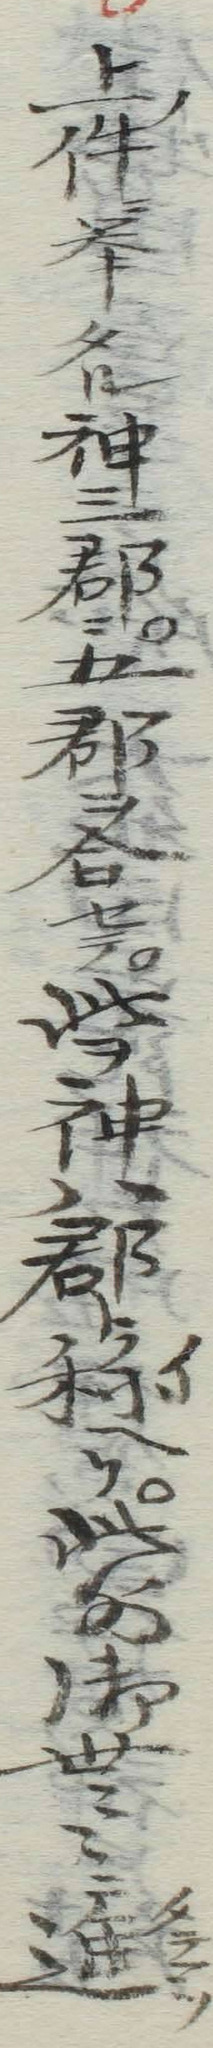○上件挙タル神三郡ニ。五郡ヲ合セテ。此ヲ神八郡ト称ヘリ。此外御世々ニテ進
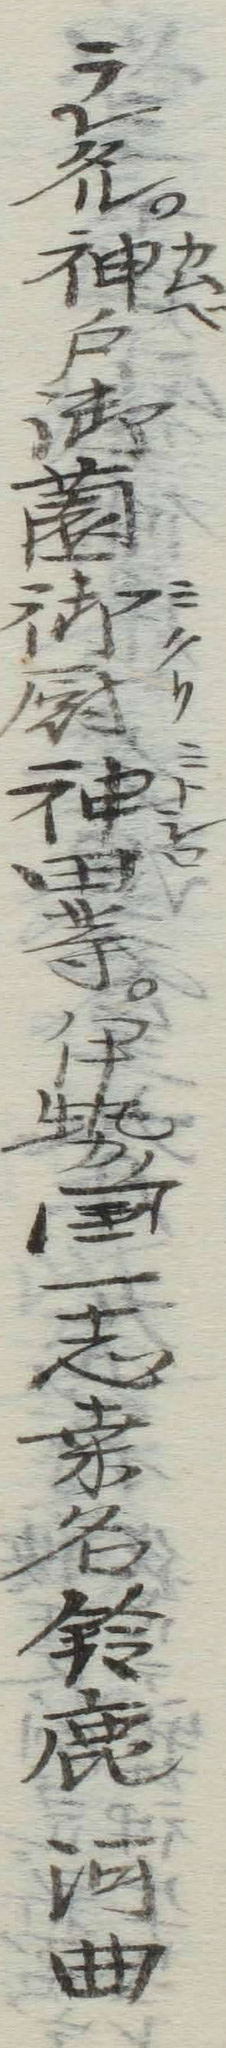ラレタル。神戸御薗御厨神田等。伊勢国一志桑名鈴鹿河曲
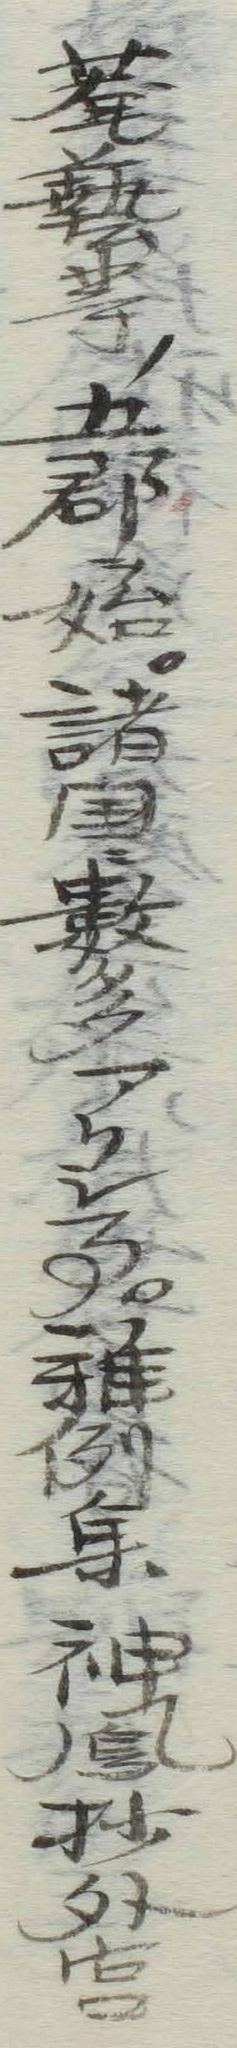菴藝等五郡ヲ始。諸国ニ数多アリシ事。雑例集神鳳抄外宮

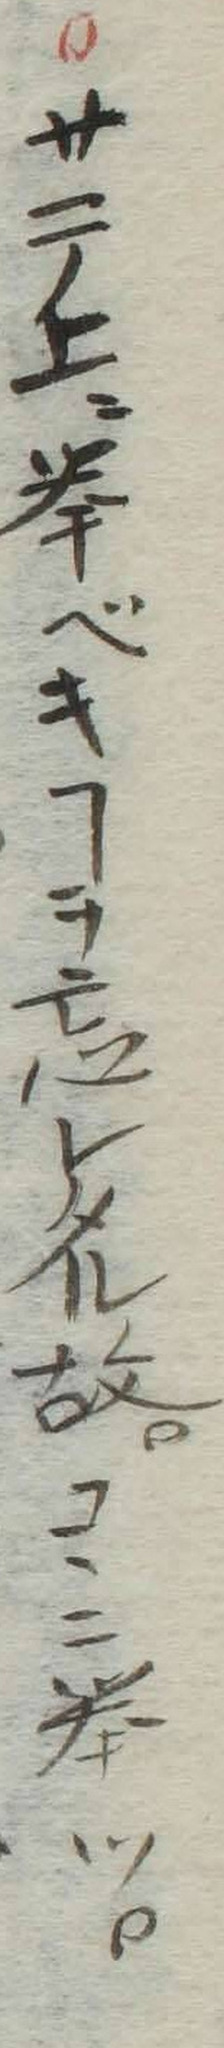○サテ上挙ベキコトヲ忘レタル故。コヽニ挙ツ。
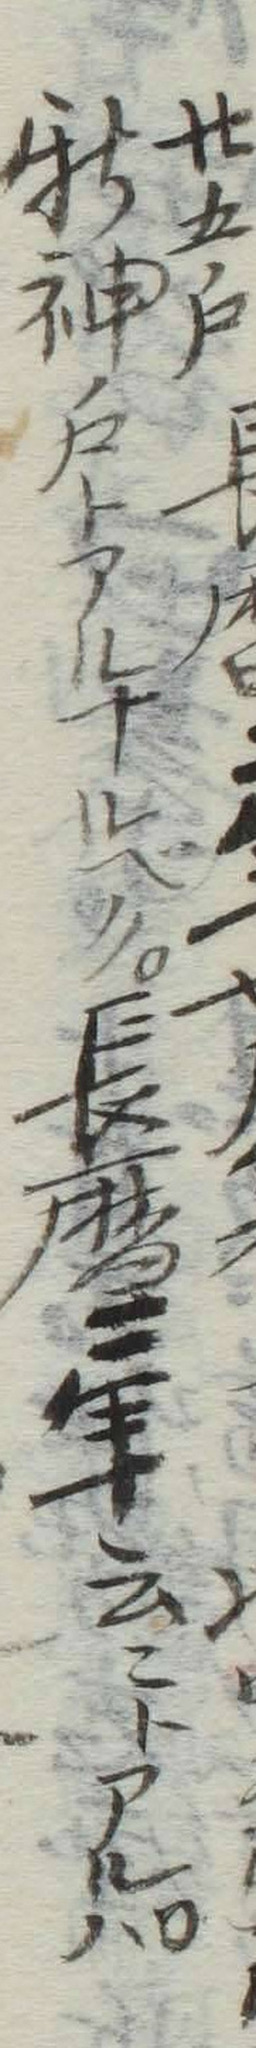新神戸トアルナルベク。長暦二年云々トアルハ。
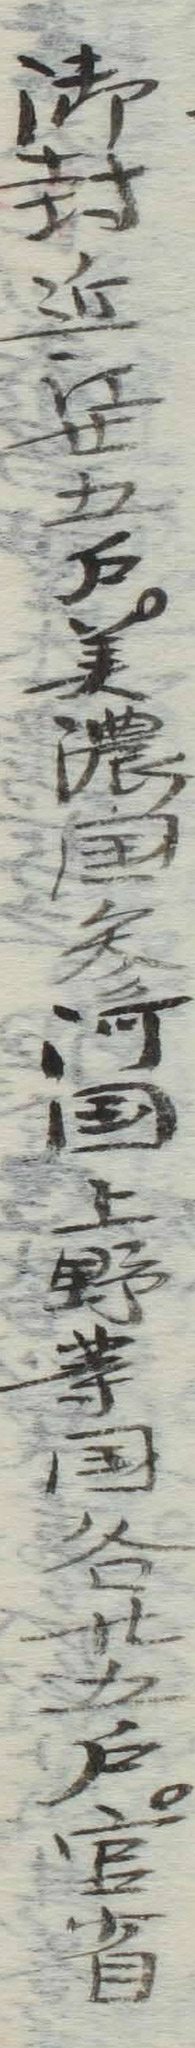御封近江廿五戸。美濃国参河国上野等国各廿五戸。官省
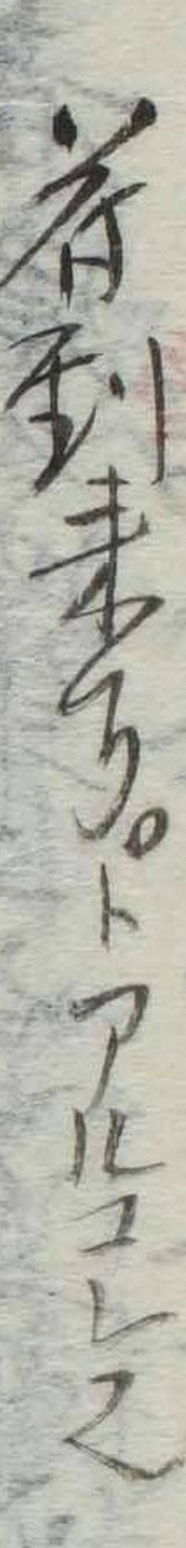符到来了。トアルコレ也
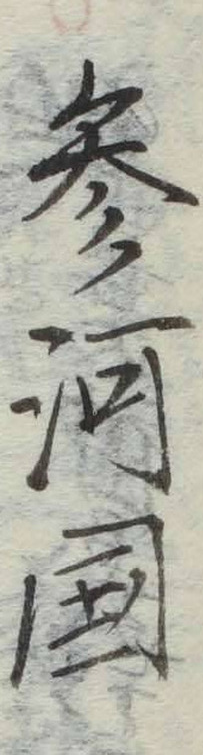参河国
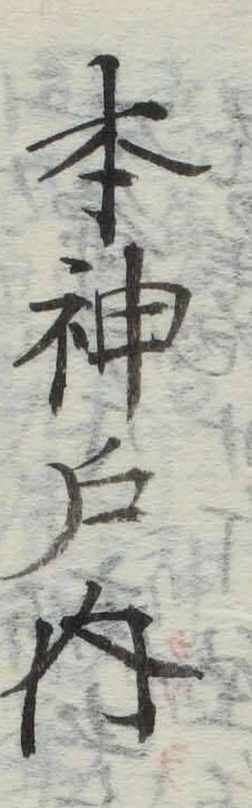本神戸内
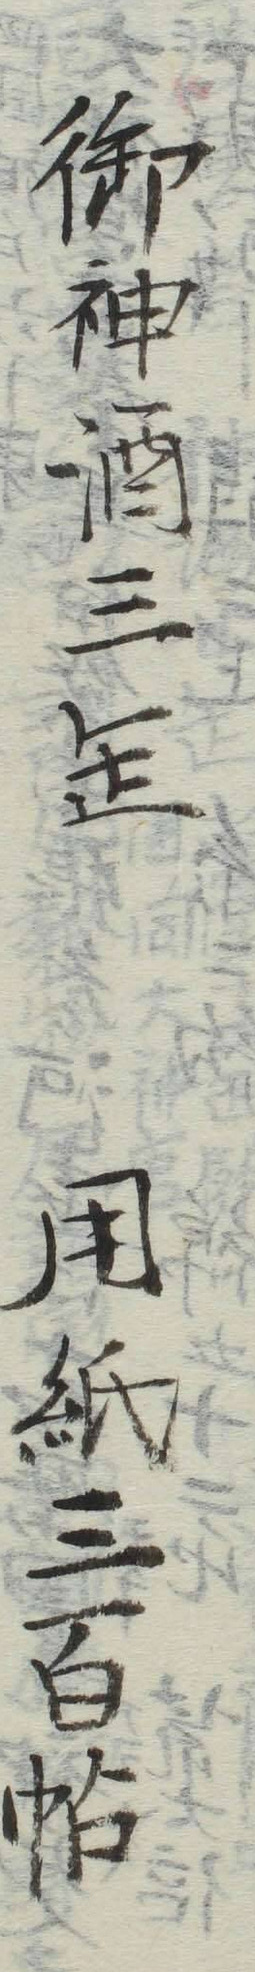御神酒三缶用紙三百帖
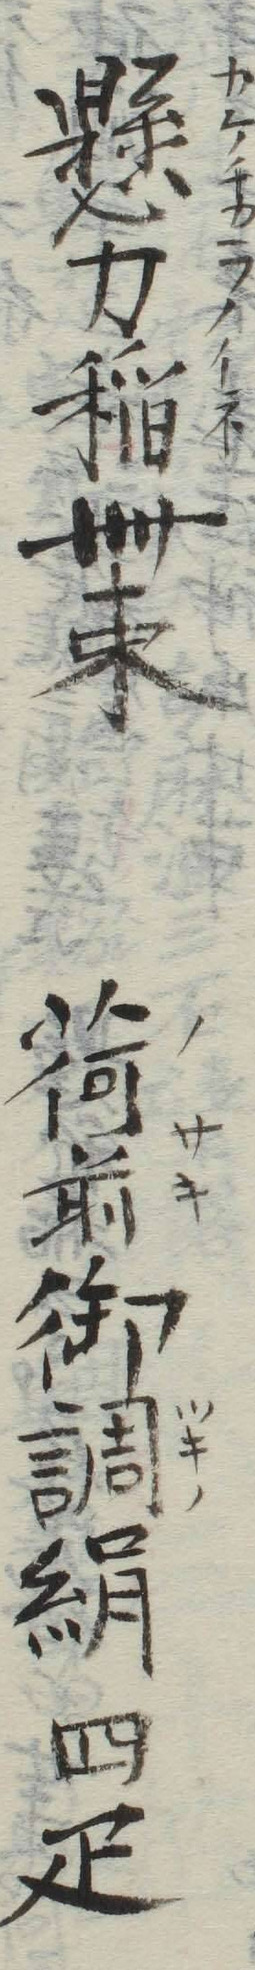懸力稲四十束荷前御調絹四疋
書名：神戸御厨御薗考
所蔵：国文学研究資料館
